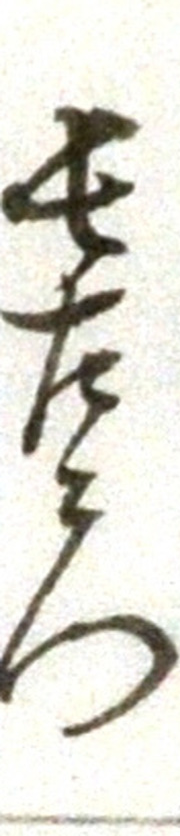長右衛門
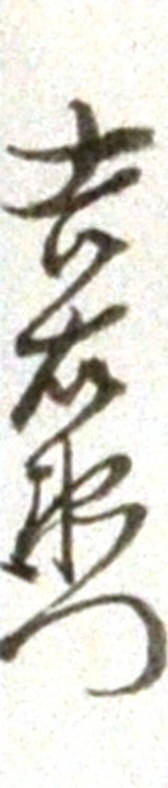長右衛門
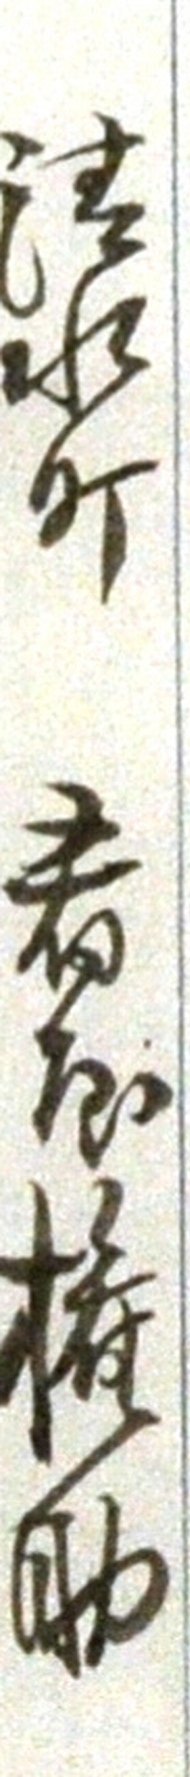清水町肴屋権助
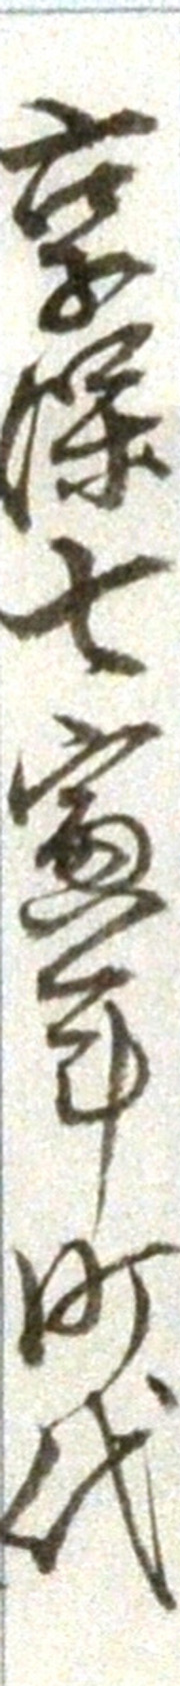享保七寅年町代
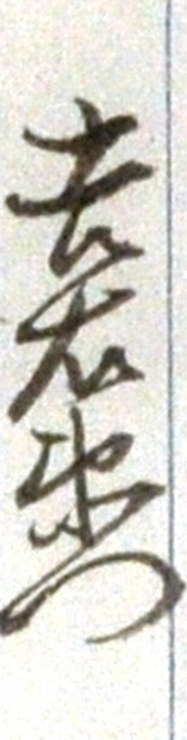長右衛門
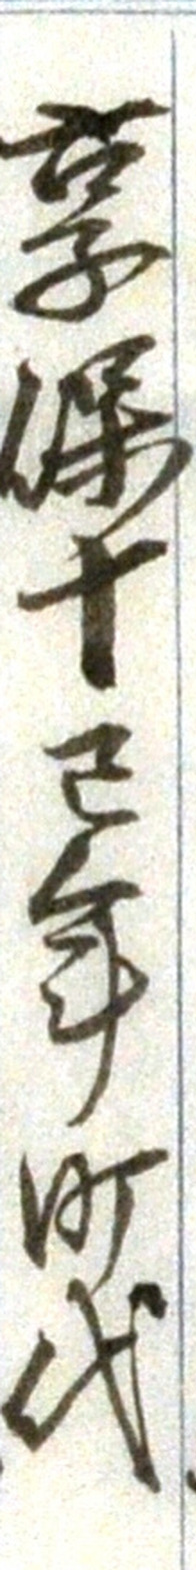享保十巳年町代
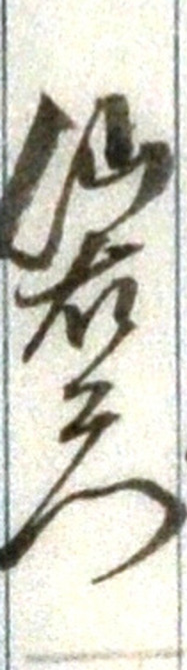長右衛門
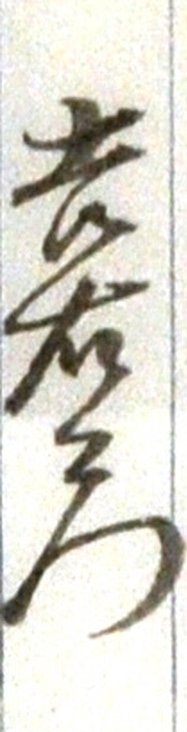長右衛門
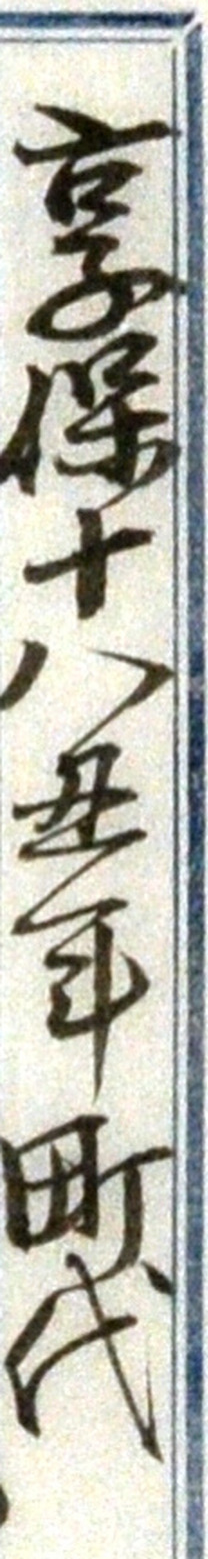享保十八丑年町代
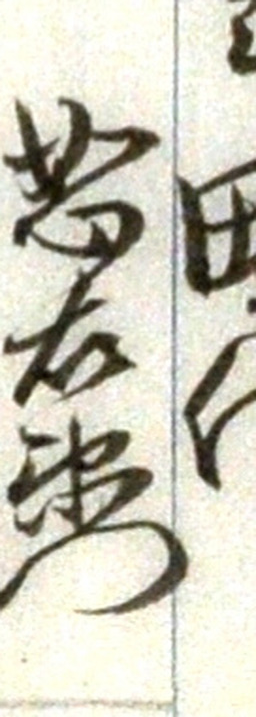長右衛門
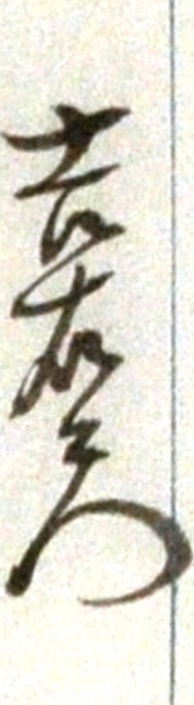長右衛門
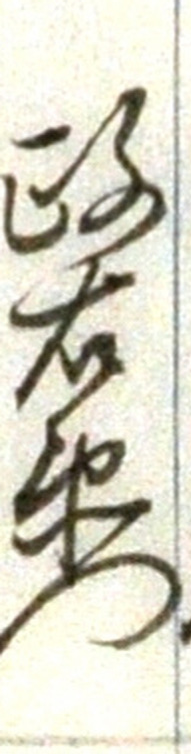長右衛門
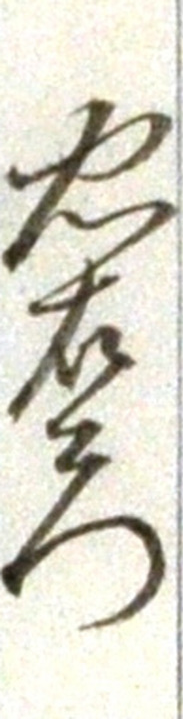長右衛門
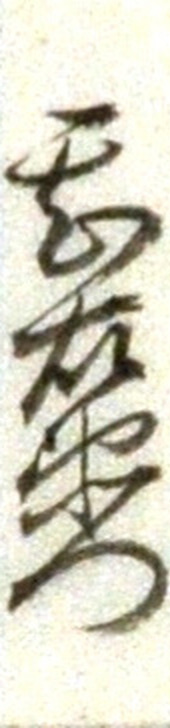長右衛門
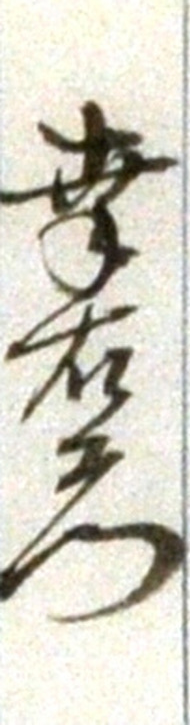長右衛門
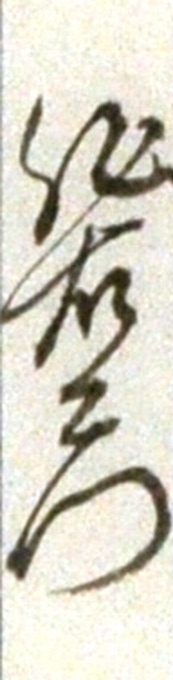長右衛門
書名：町方町代名前書
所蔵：伊那市立高遠町図書館・合同会社AMANE
